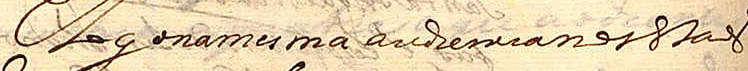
E logo na mesma audiencia nos staos
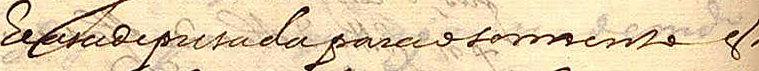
E casa deputada para o tormento es
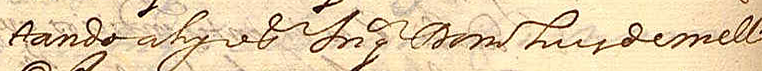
tando ahy o s̄r Inqor Dom Luis de mello
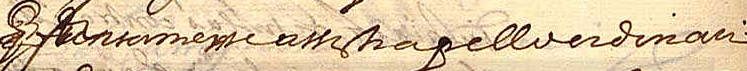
q̄ Juntamente assistia pello ordinario
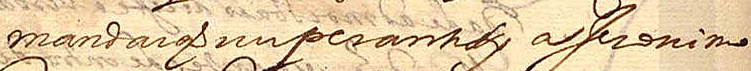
mandaraõ uir perante sy a Jeronimo
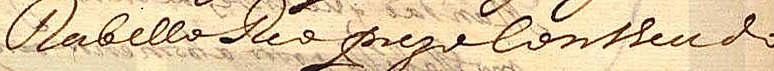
Rabello Reo prezo contheudo
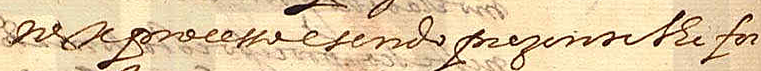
neste processo e sendo prezente lhe foi
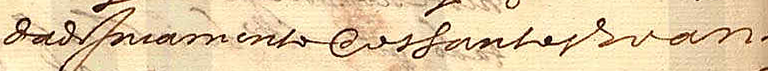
dado Juramento dos santos Evan
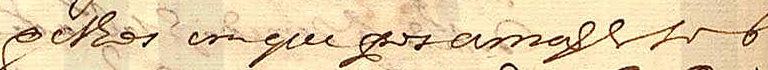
gelhos em que pos a maõ e sob
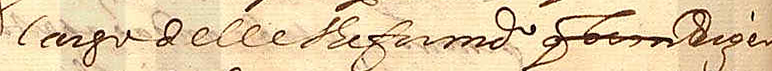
cargo delle lhe foi mdo q̄ bem dizer
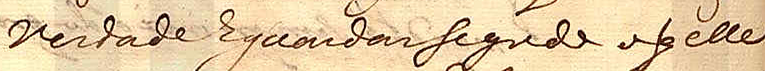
verdade E guardar segredo o q̄ elle
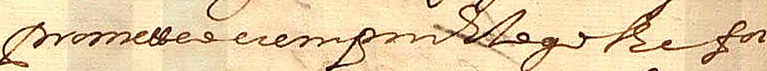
prometto cumprir E logo lhe foi
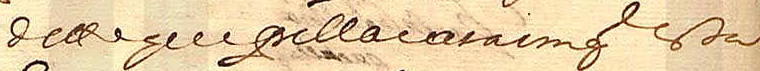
ditto que pella casa em q̄ esta
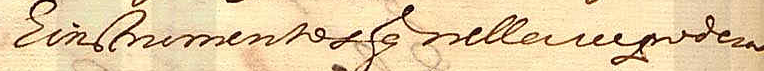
E instrumentos q̄ nella ve podera
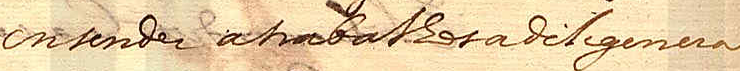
entender a trabalhosa diligencia
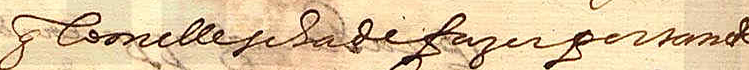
q̄ Com elle se hade fazer portanto
